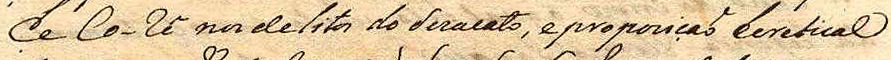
he Co-Ré nos delitos do dezacato, e propoziçaõ heretical
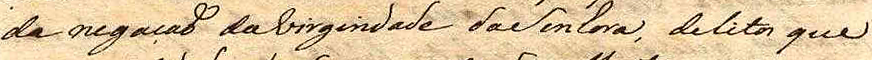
da negaçaõ da Virgindade da Senhora, delitos que
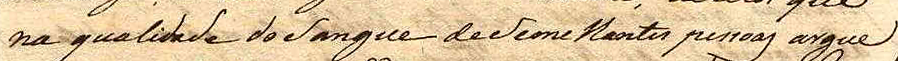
na qualidade do sangue de semelhantes pessoas argue
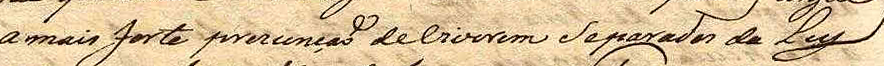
a mais forte presunçaõ de viverem separadas da Ley
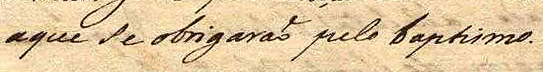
a que se obrigaraõ pelo baptismo.
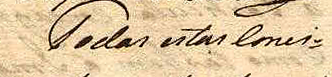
Todas estas Conci
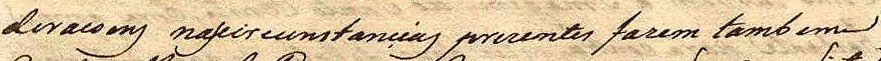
deraçoens nas circunstançias prezentes fazem tambem
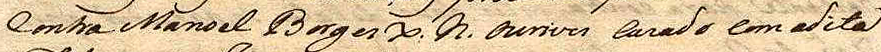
Contra Manoel Borges x. n. ourives cazado com a dita
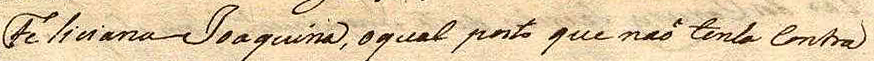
Feliciana Ioaquina, o qual posto que naõ tenha contra
